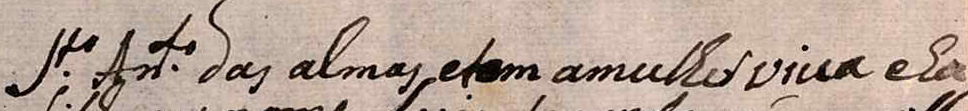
S.to An.to das almas, e tem a mulher viua, e hū
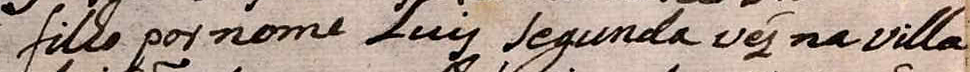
filho por nome Luis segunda véz na villa
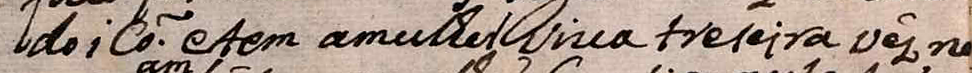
do Icõ. e tem a mulher viua tresejra ves no
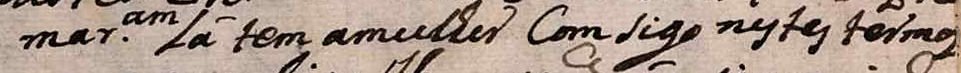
mar.am Lá tem a mulher Comsigo nestes termos
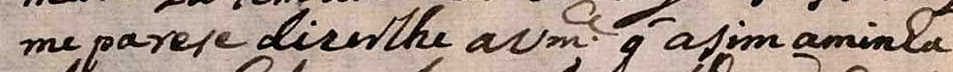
me parese dizerlhe a vm.ce q̄ asim a minha
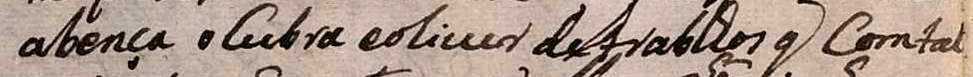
abença o Cubra e o liuer de trabalhos q̄ Com tal
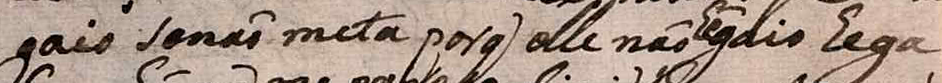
gaio senaõ meta porq̄ elle naõ hé gaio he ga
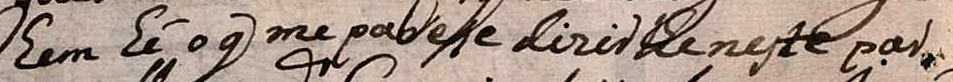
hem hé o q̄ me paresse dizerlhe neste par
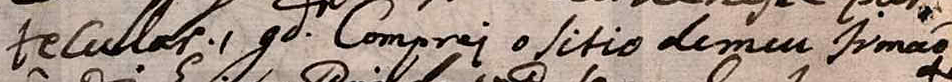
teCullar./ qd.o Comprej o sitio de meu Jrmaõ
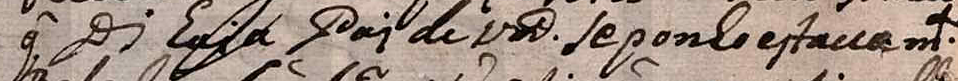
q̄ Ds̄ haja Pai de vm.ce seponho estaua m.to
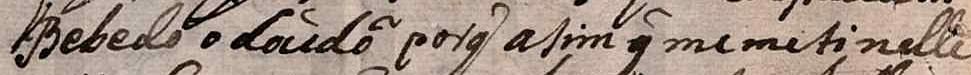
Bebedo o doudo porq̄ asim q̄ me meti nelle
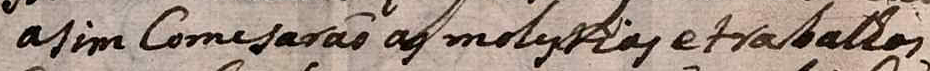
asim Comesaraõ as molestias e trabalhos.
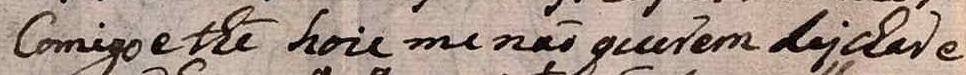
Comigo e thé hoie me naõ querem dejchar e
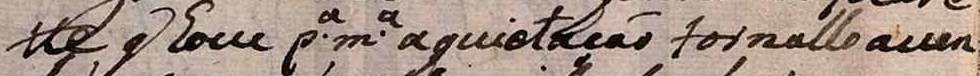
tte q̄ houe p.a m.a aquietaçaõ tornallo a uen
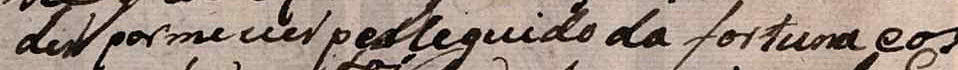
der por me uer perseguido da fortuna e os
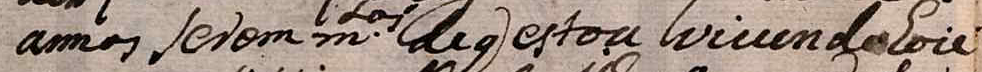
annos serem m.tos de q̄ estou viuendo hoie
